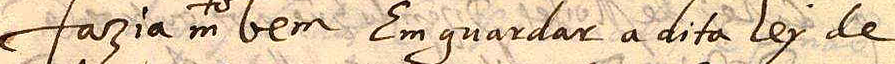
fazia mto bem Em guardar a dita Ley de
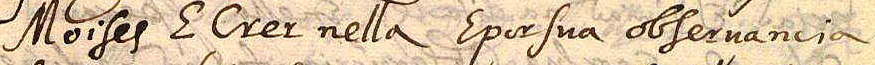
Moises E Crer nella E por sua obseruancia
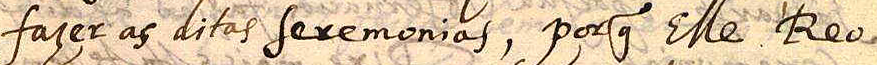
fazer as ditas seremonias, porq̄ Elle Reo
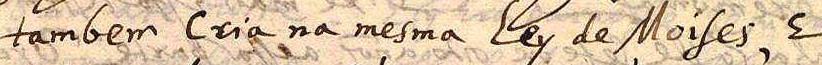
tambem Cria na mesma Ley de Moises, E
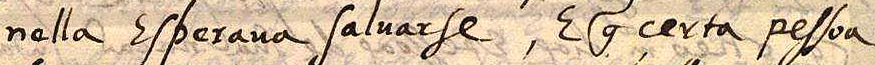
nell Esperaua saluarse, E q̄ çerta pessoa
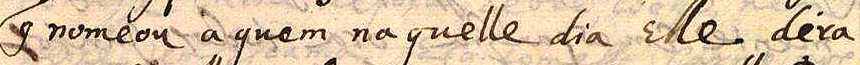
q̄ nomeou a quem naquelle dia Elle dera
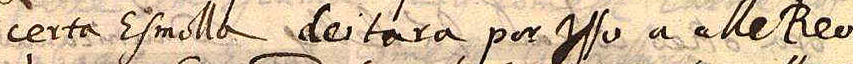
çerta Esmolla deitara por Jsso a elle Reo
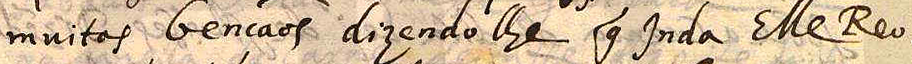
muitas bençãos dizendo lhe q̄ Jnda Elle Reo
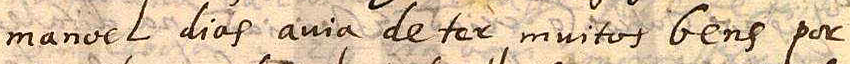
manoel dias auia de ter muitos bens por
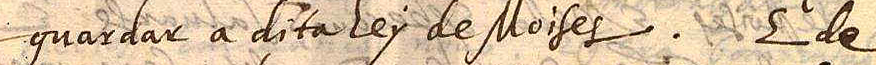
guardar a dita ley de Moises. E de
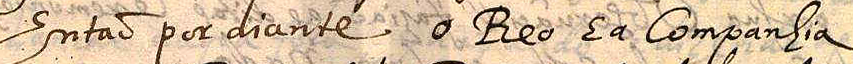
Entaõ por diante o Reo E a Companhia
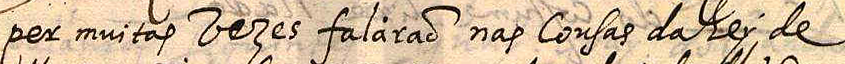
per muitas Vezes falaraõ nas Cousas da Ley de
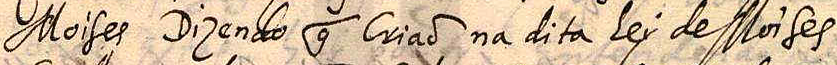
Moises Dizendo q̄ Criaõ na dita ley de Moises
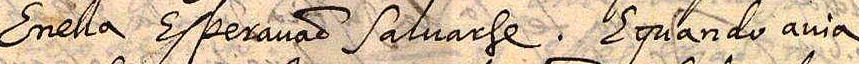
E nella Esperauão saluarse. E quando auia
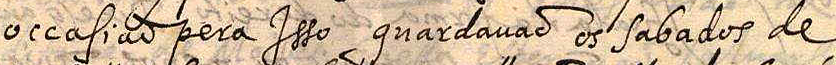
occasiaõ pera Jsso guardauaõ os sabados de
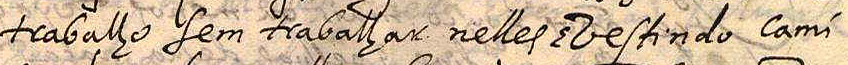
trabalhos sem trabalhar nelles E vestindo cami
